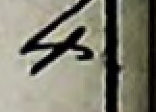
4
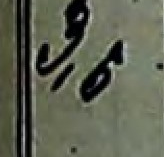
3,5
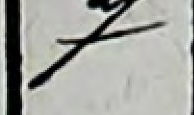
7
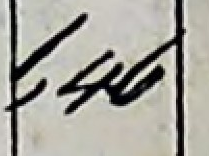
1,46
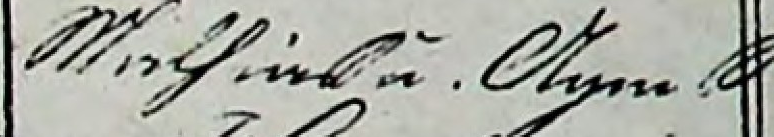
Mathias u. Agnes
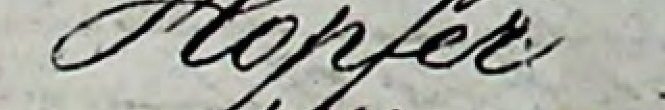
Hopfer
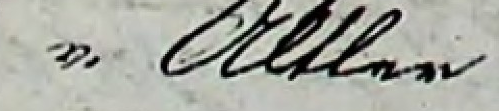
v. Altler
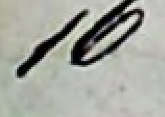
16
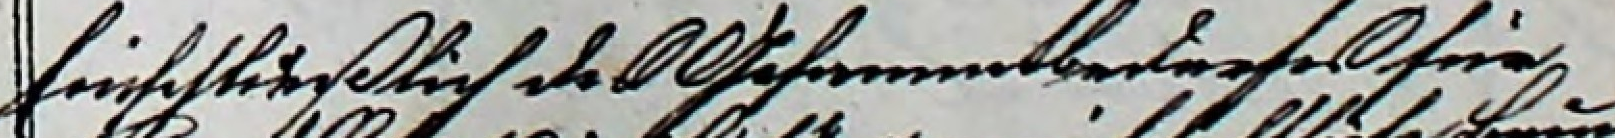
Einschließlich des Gesammtbedarfes für
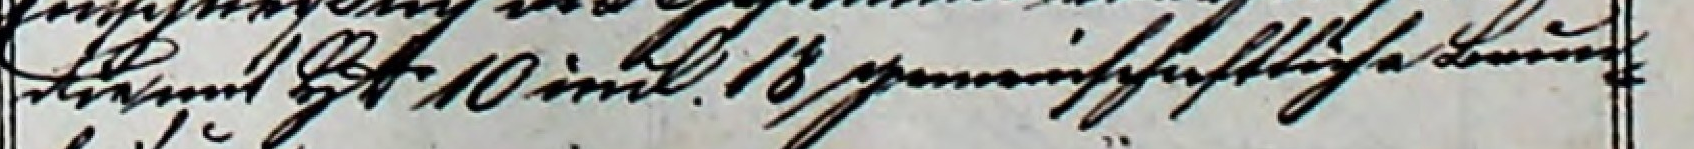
die mit H? 10 inil. 18 gemeinschaftliche Baum„
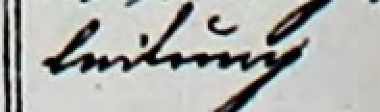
leitung
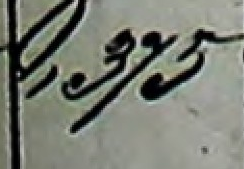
0,375
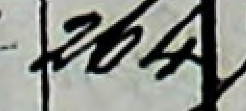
264
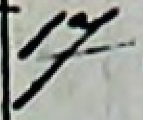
17
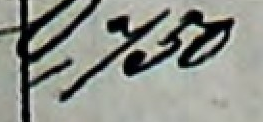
0,750
